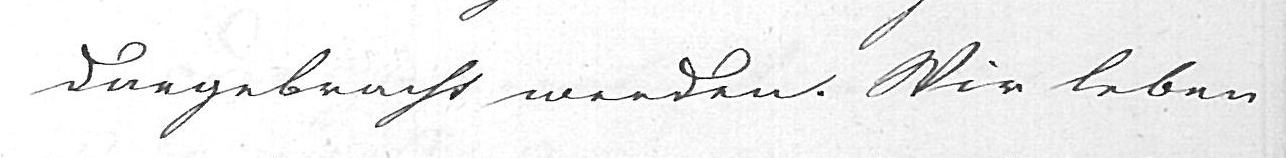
dargebracht werden. Wir leben
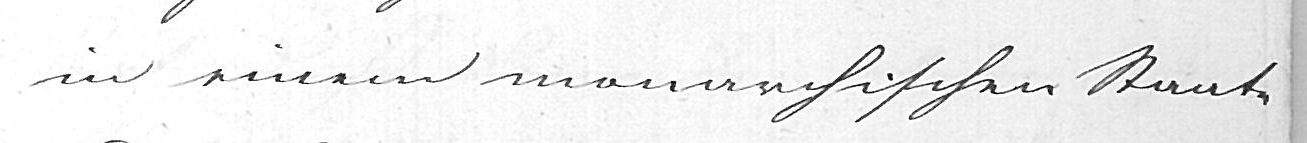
in einem monarchischen Staate
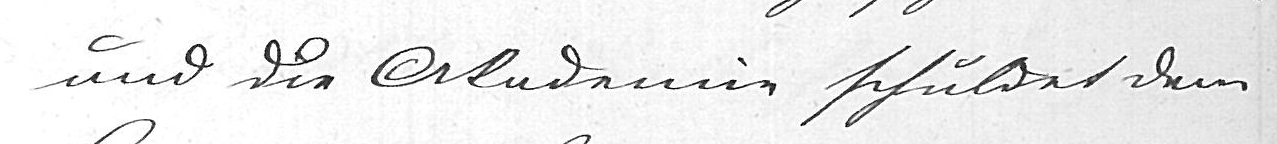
und die Akademie schuldet dem
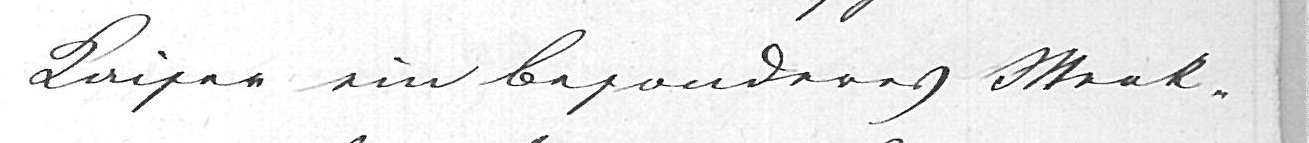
Kaiser ein besondere Merk-
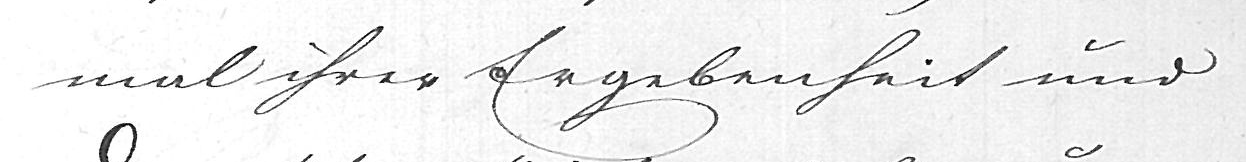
mal ihrer Ergebenheit und
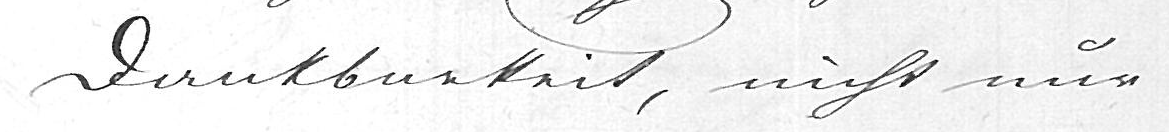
Dankbarkeit, nicht nur
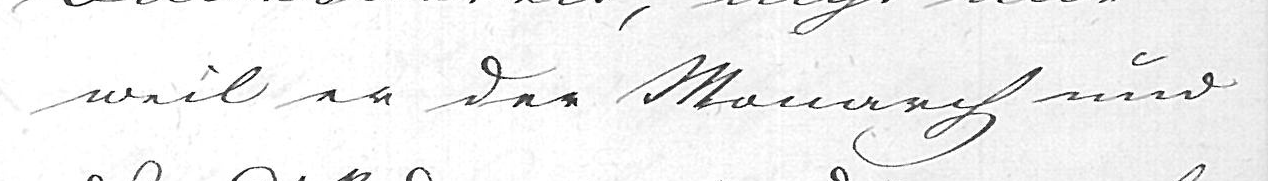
weil er der Monarch und
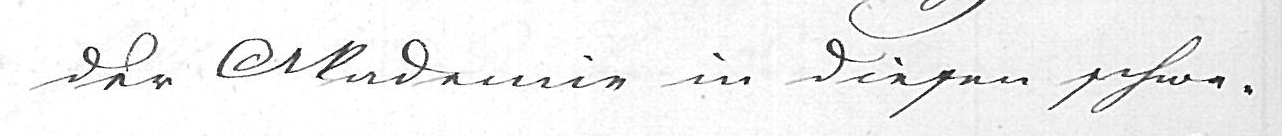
der Akademie in diesen schwe-
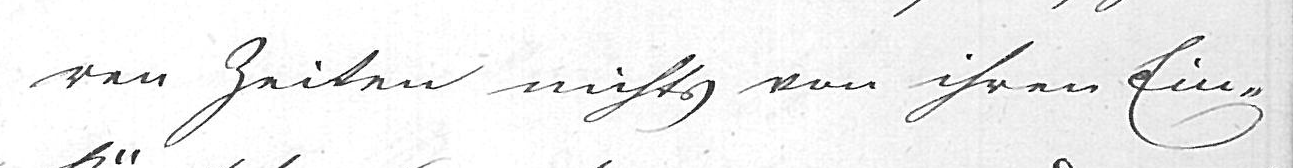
ren Zeiten nichts von ihren Ein-
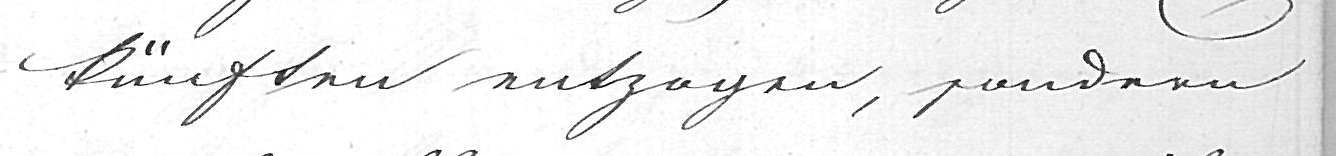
künften entzogen, sondern
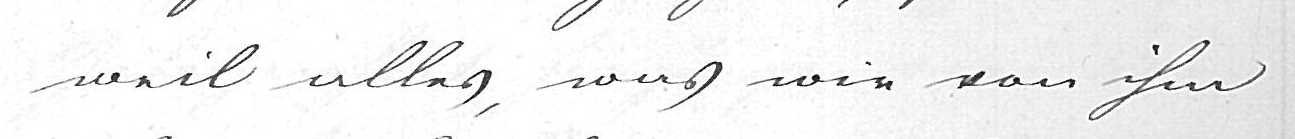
weil alles, was wir von ihm
